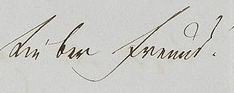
Lieber Freund!
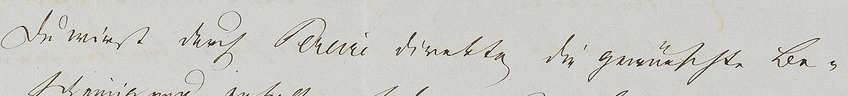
Du wirst durch Pereire direkte die gewünschte Be-
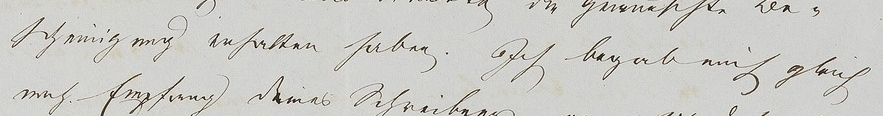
scheinigung erhalten haben. Ich begab mich gleich
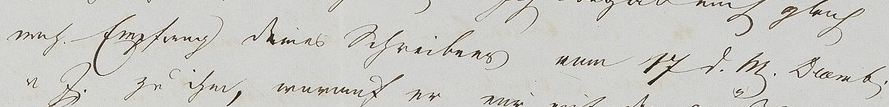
nach Empfang Deines Schreibens vom 17 d. M. Decemb.
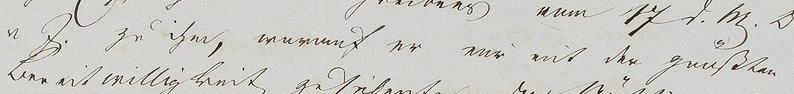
vJ. zu ihm, worauf er mir mit der größten
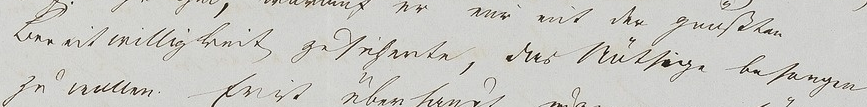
Bereitwilligkeit zusicherte, das Nöthige besorgen
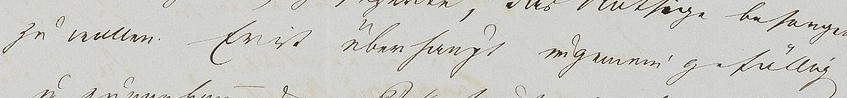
zu wollen. Er ist überhaupt ungemein gefällig
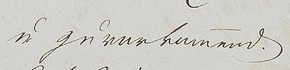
u. zuvorkommend.
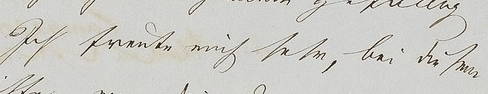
Ich freute mich sehr, bei diesem
